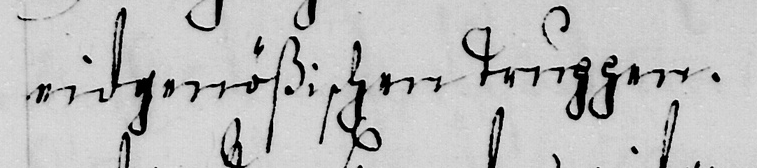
eidgenößischen Truppen.
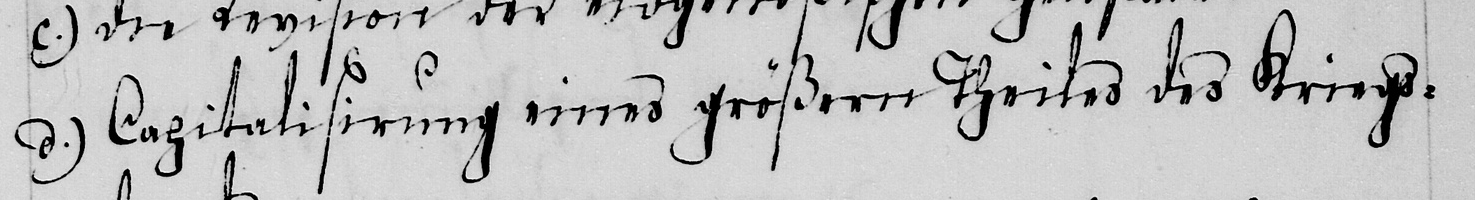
d.) Capitalisirung eines größern Theiles des Kriegs¬
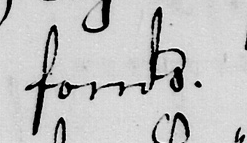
fonds.
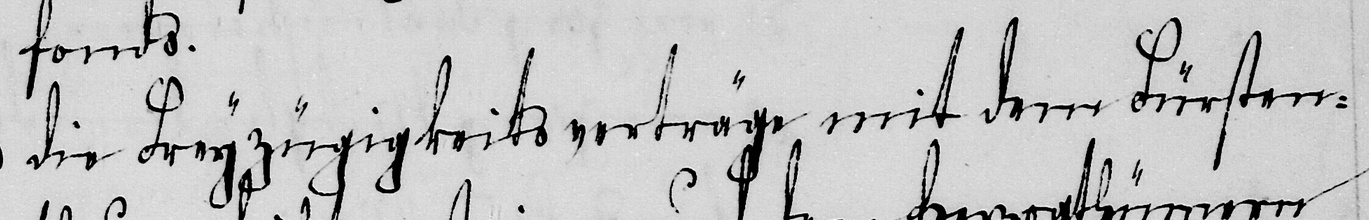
die Freyzügigkeitsverträge mit dem Fürsten¬
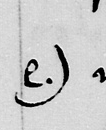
8.)
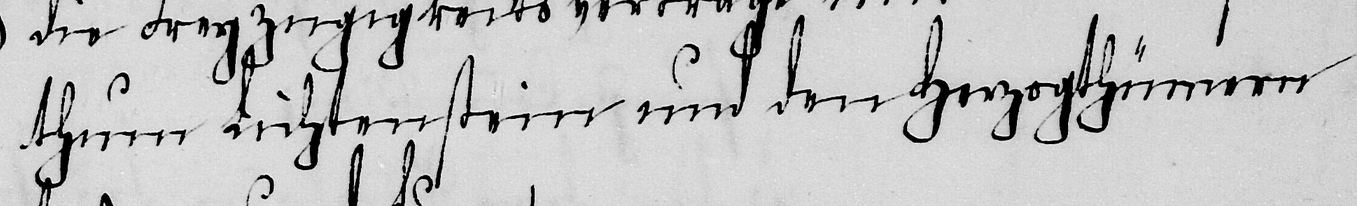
thum Lichtenstein und den Herzogthümern
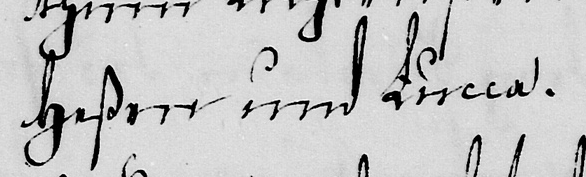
Heßen und Lucc¬
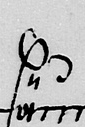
a.
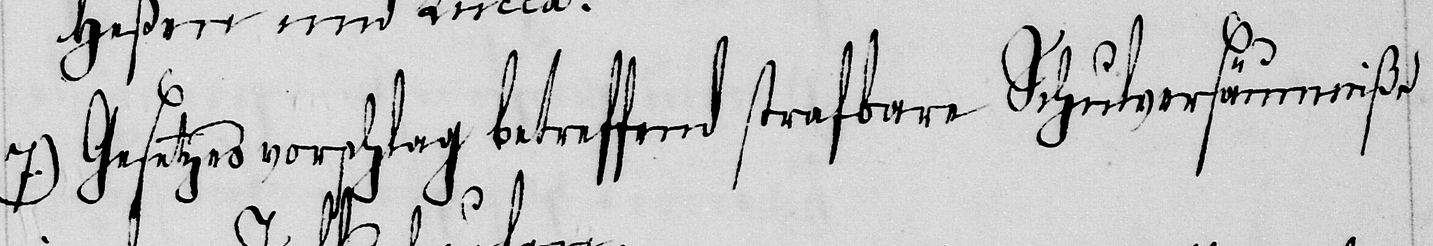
Gesetzesvorschlag betreffend strafbare Schulversäumniße
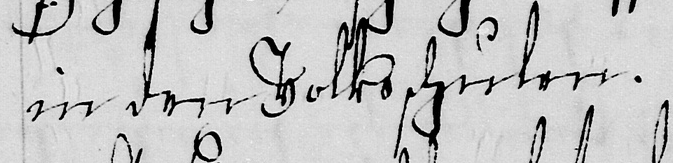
in den Volksschulen.
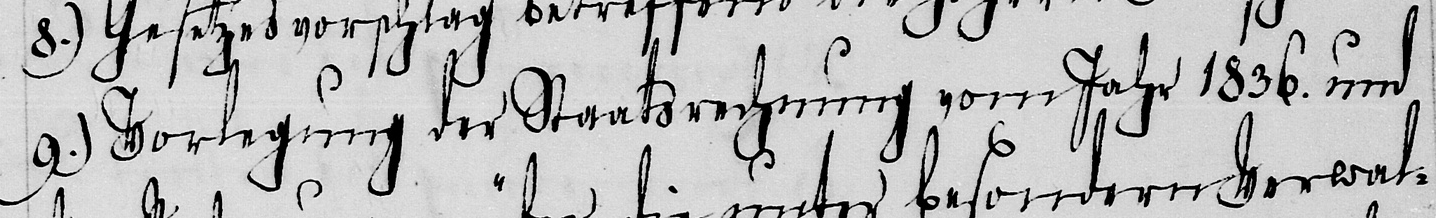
9.) Vorlegung der Staatsrechnung vom Jahr 1836. und
